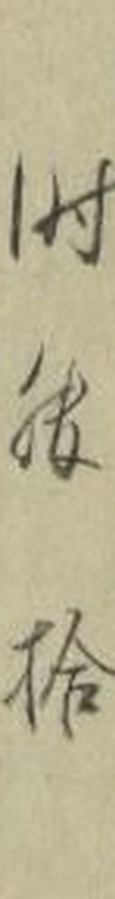時服拾
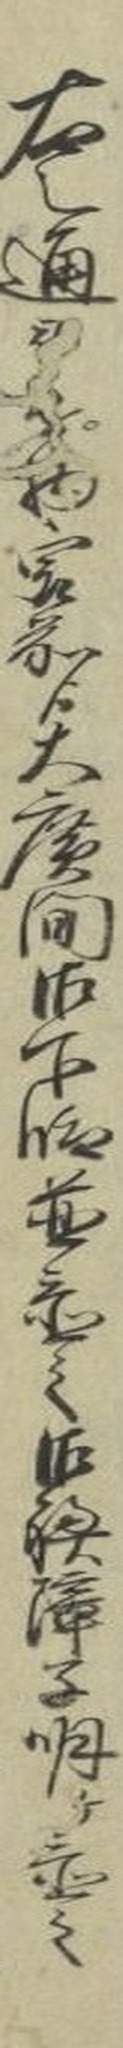右之通被遣物最前ゟ大広間御下段並置之御襖障子明け置之
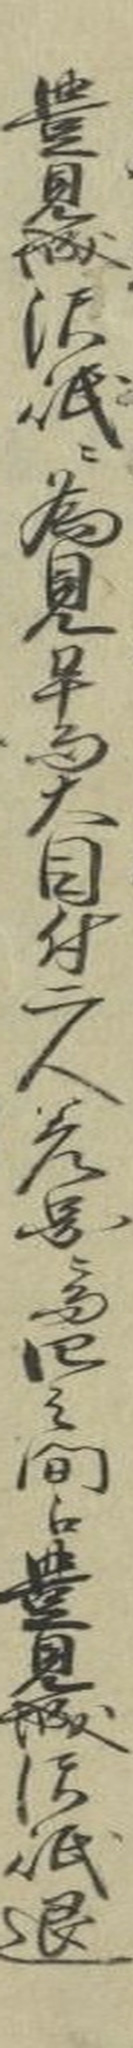豊見城沢岻に為見畢て大目付二人差図にて四之間え豊見城沢岻退
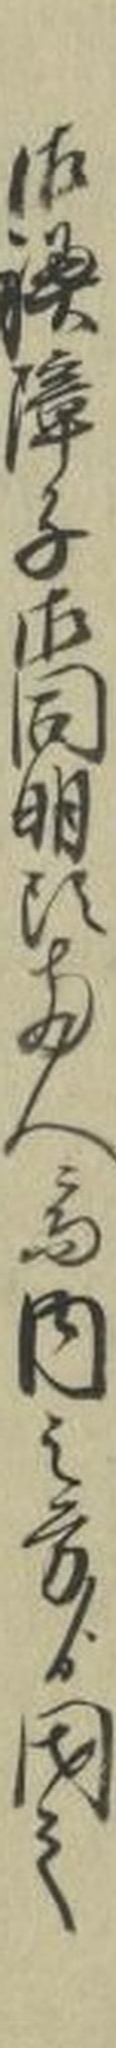御襖障子御同朋頭両人にて内之方ゟ閉之
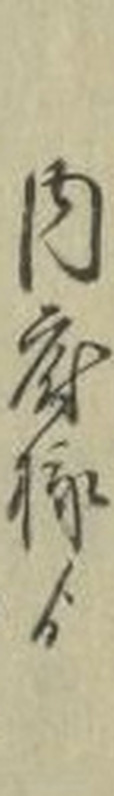内府様ゟ
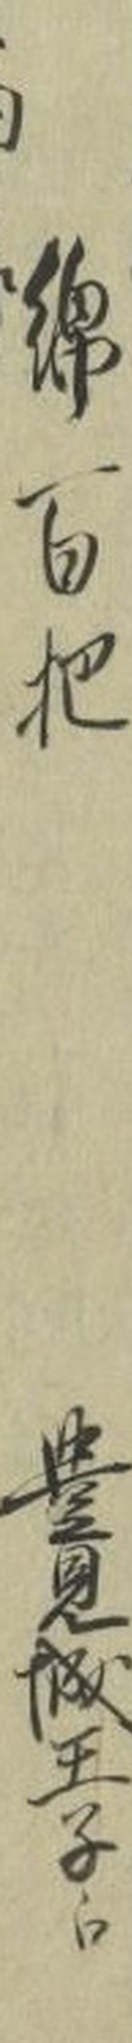綿百把豊見城王子え
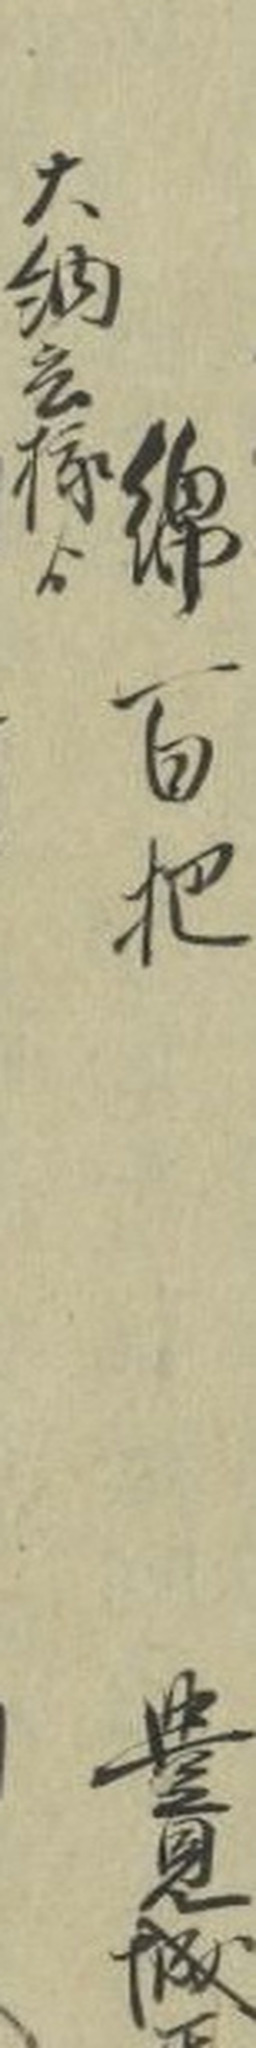大納言様ゟ
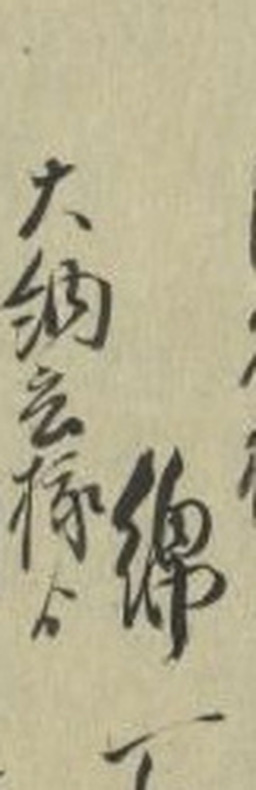大納言様ゟ
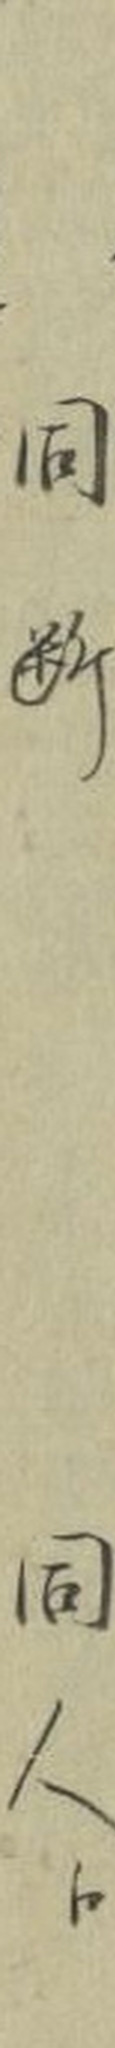同断同人え
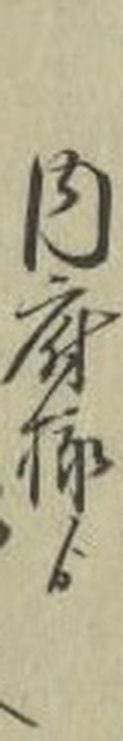内府様ゟ
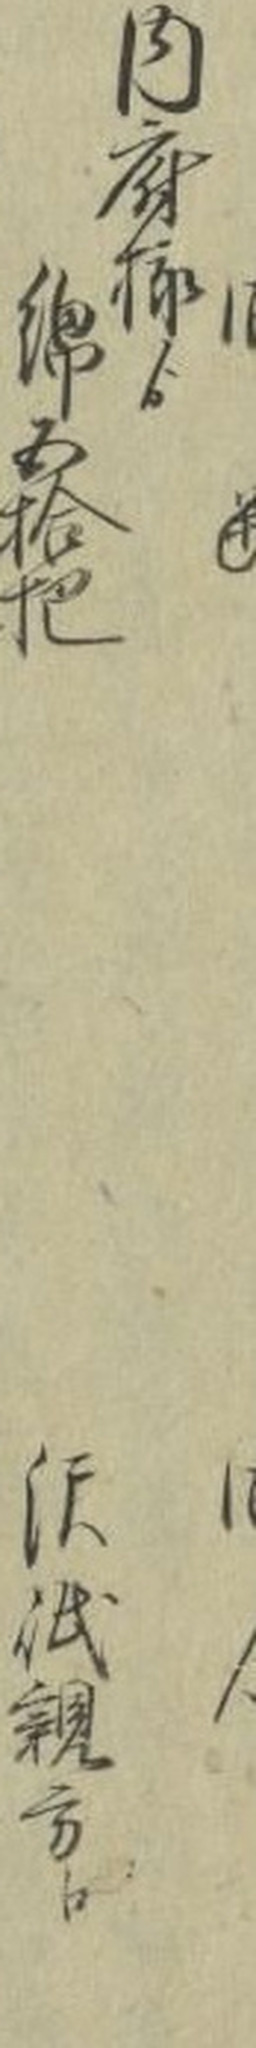綿五拾把沢岻親方え
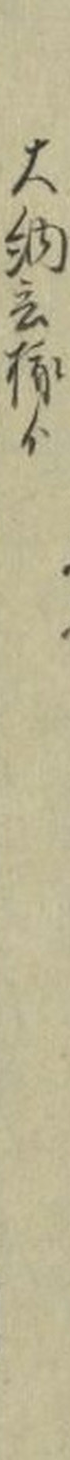大納言様ゟ
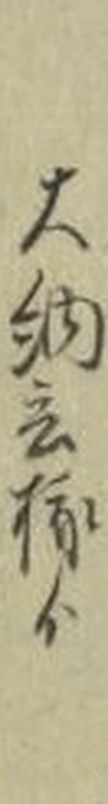大納言様ゟ
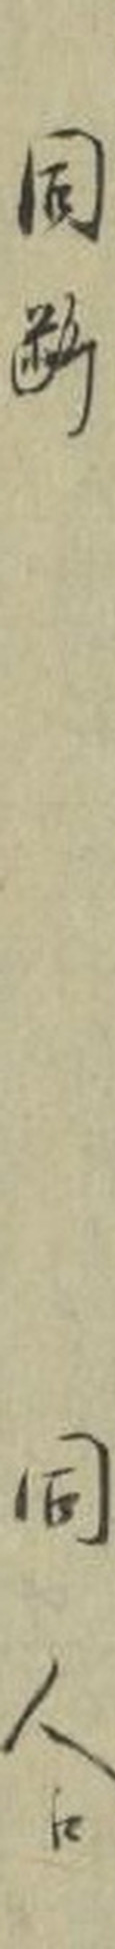同断同人え
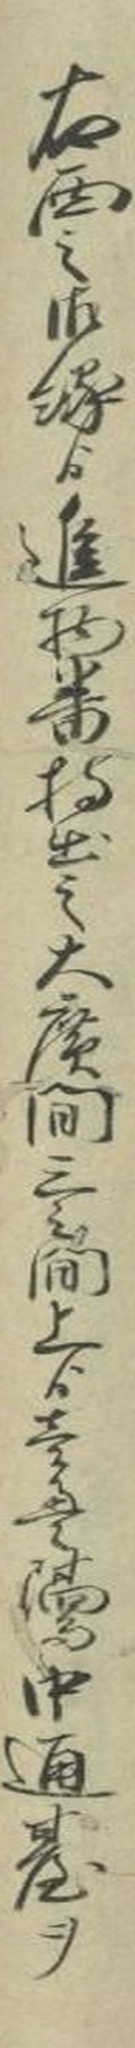右西之御縁ゟ進物番持出之大広間三之間上ゟ壱畳隔て中通台を
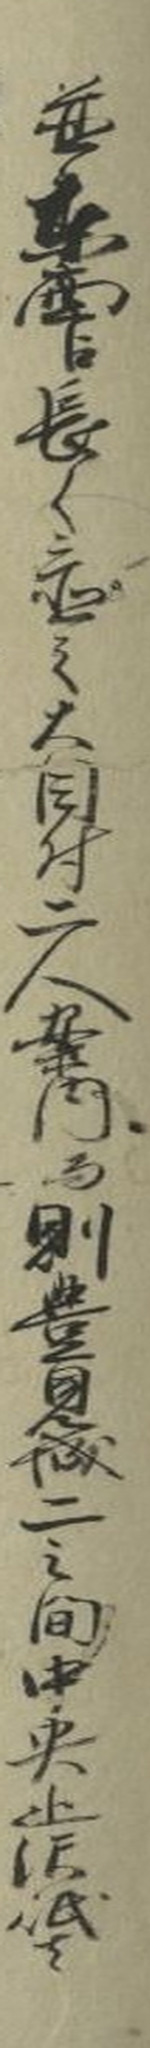並東西え長く置之大目付二人案内而則豊見城沢岻二之間中央迄沢岻は
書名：天保三壬辰年琉球人参府之節勤方書留
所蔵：University of the Ryukyus Library
